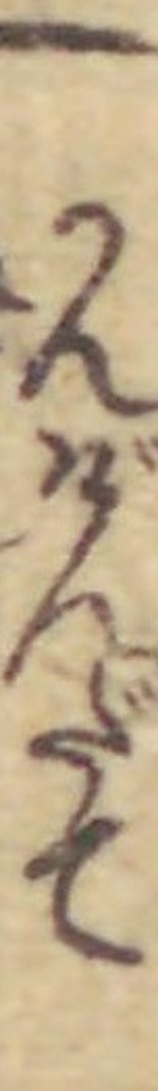かんげんだて
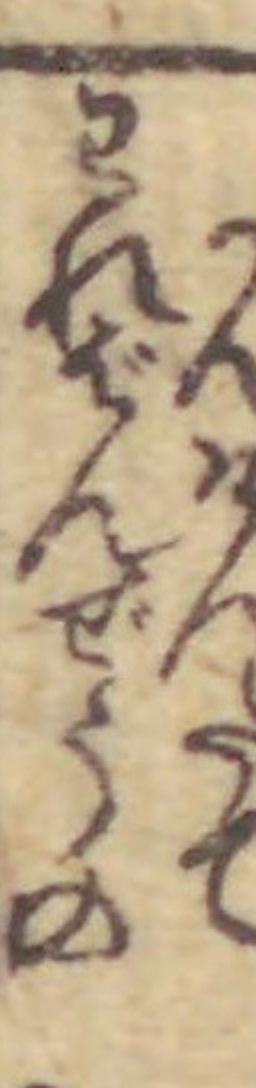わればんぜうの
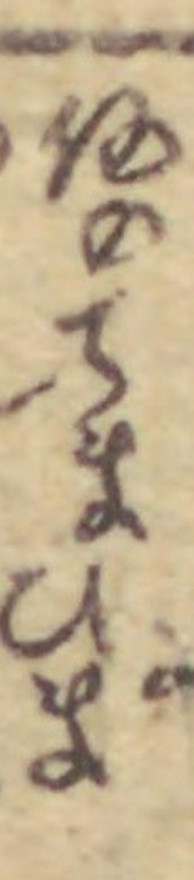何のてまひま
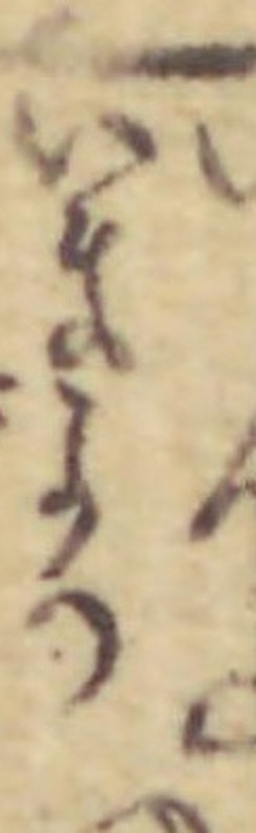いまより
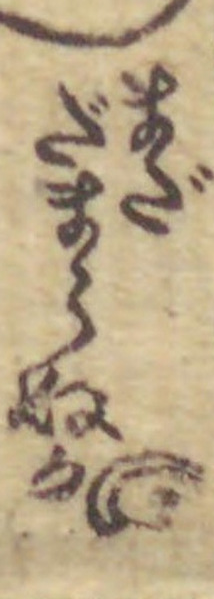だまらぬか
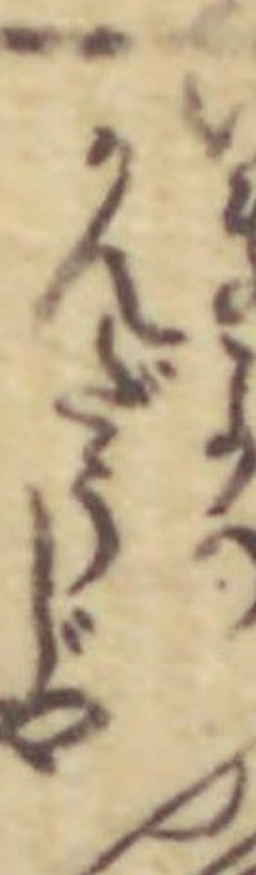かんだうじや
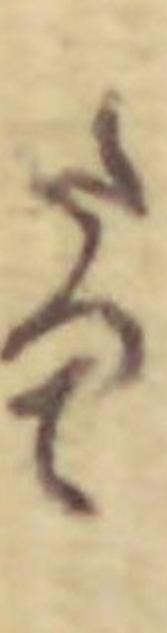たつて
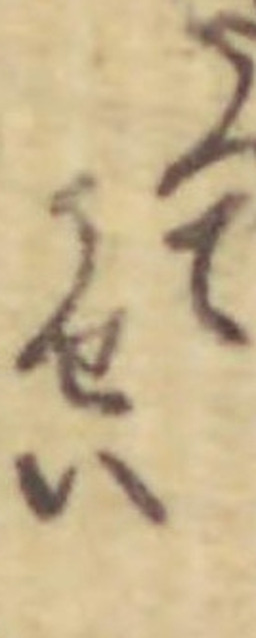うせい
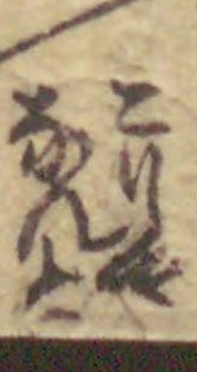なんと
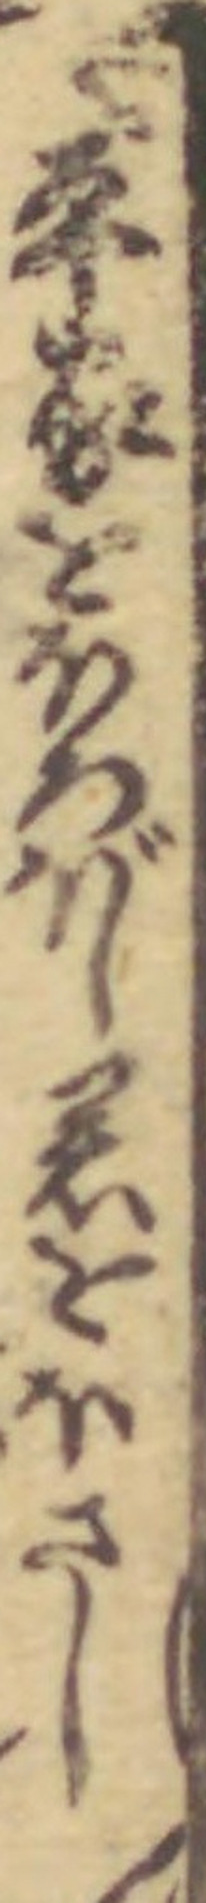平家をほろぼし君をほさし
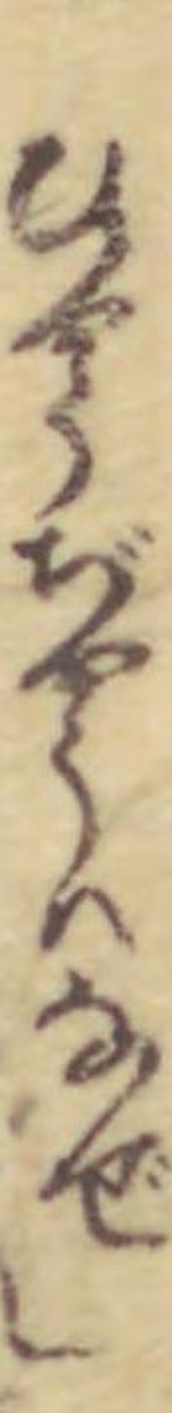ひやうぢやうはなぜ
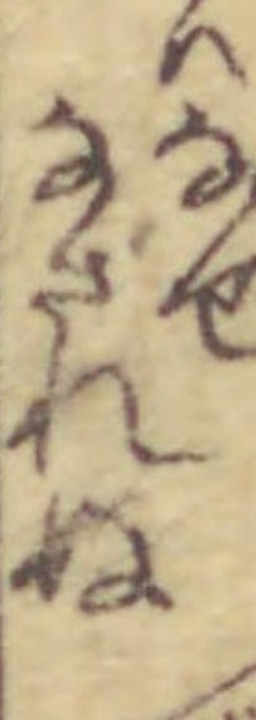なされぬ
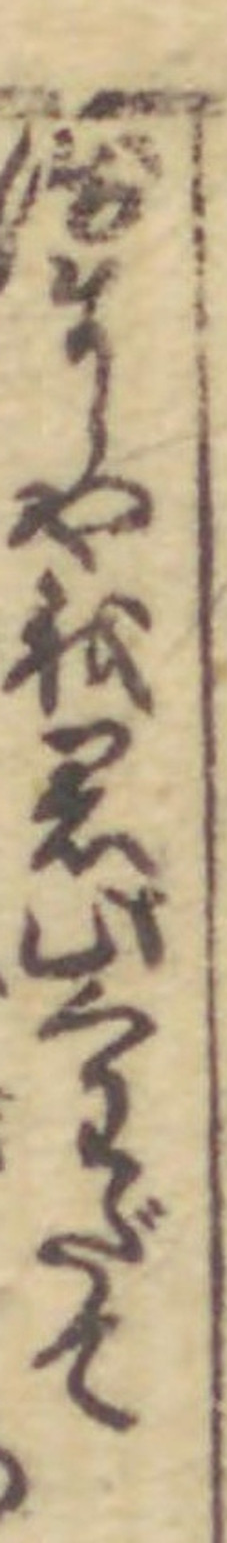浅ましや我君此くわだて
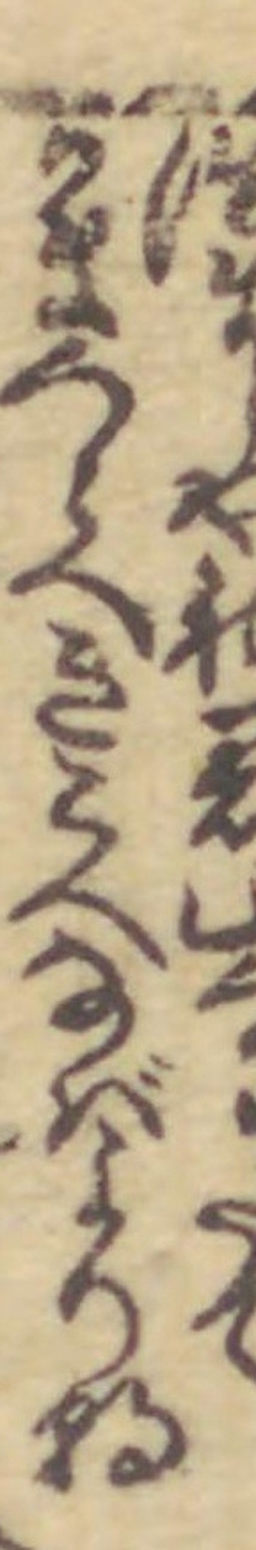かまくらへきこへなばより朝
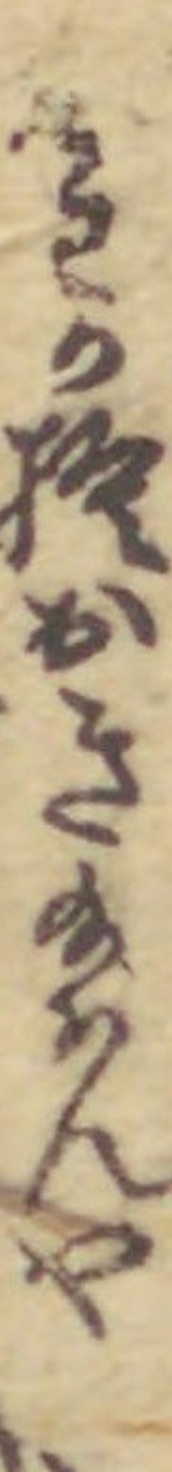わか捨おき給はんや
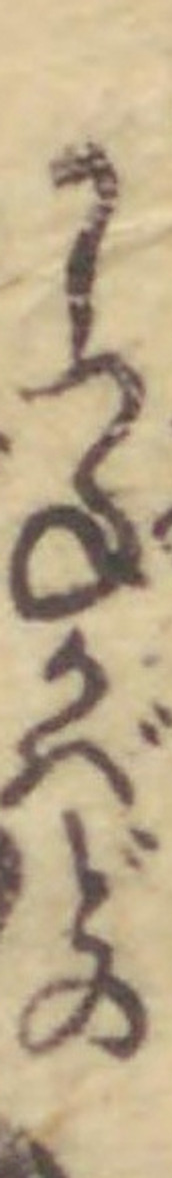よしつねかばどの
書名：朝比奈草摺実記 2巻
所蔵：国立国会図書館 National Diet Library, JAPAN
